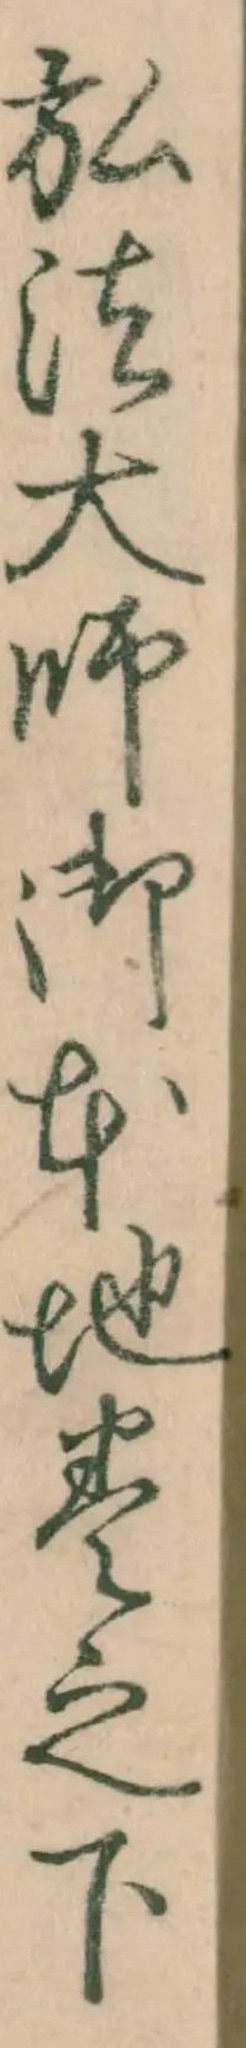弘法大師御本地巻之下
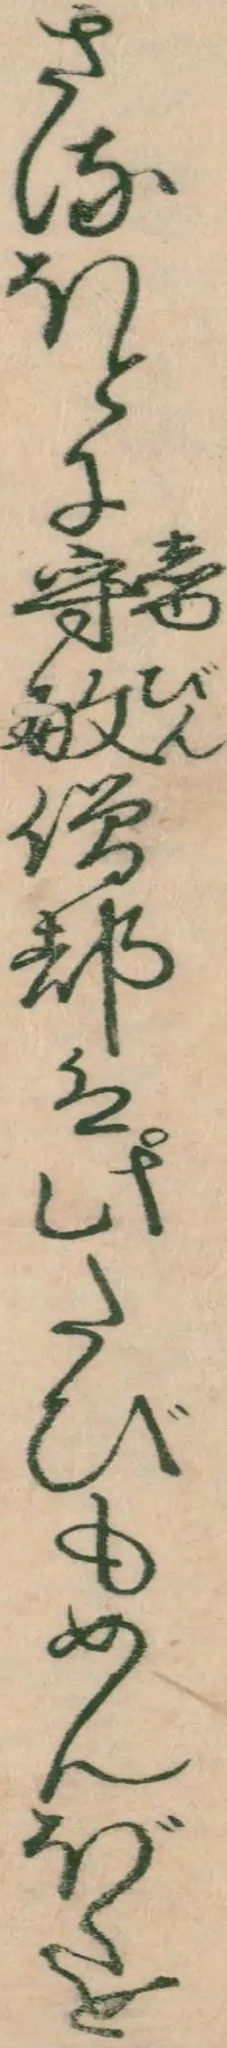さるほとに守敏僧都は。此たびもめんぼくを
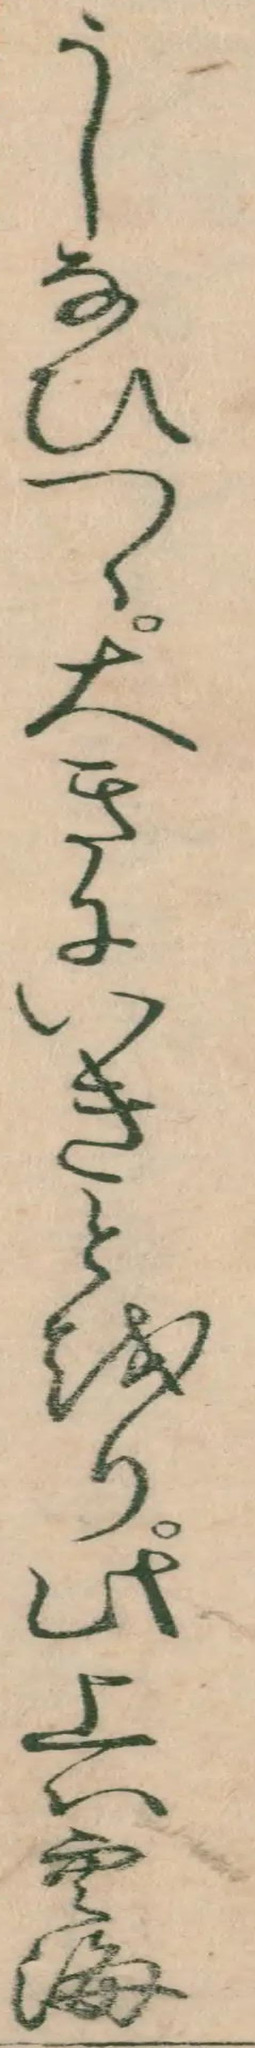うしなひつゝ。大きにいきとをり。此上は空海
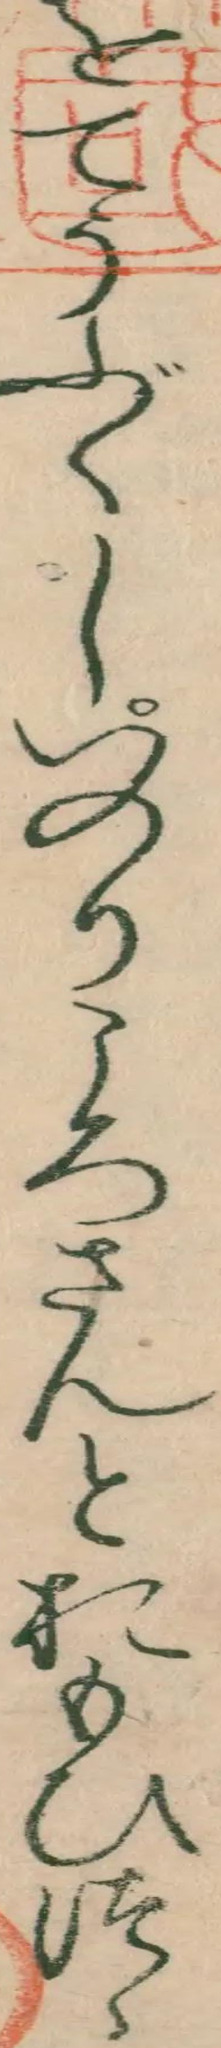をてうぶくし。いのりころさんとおもひつゝ
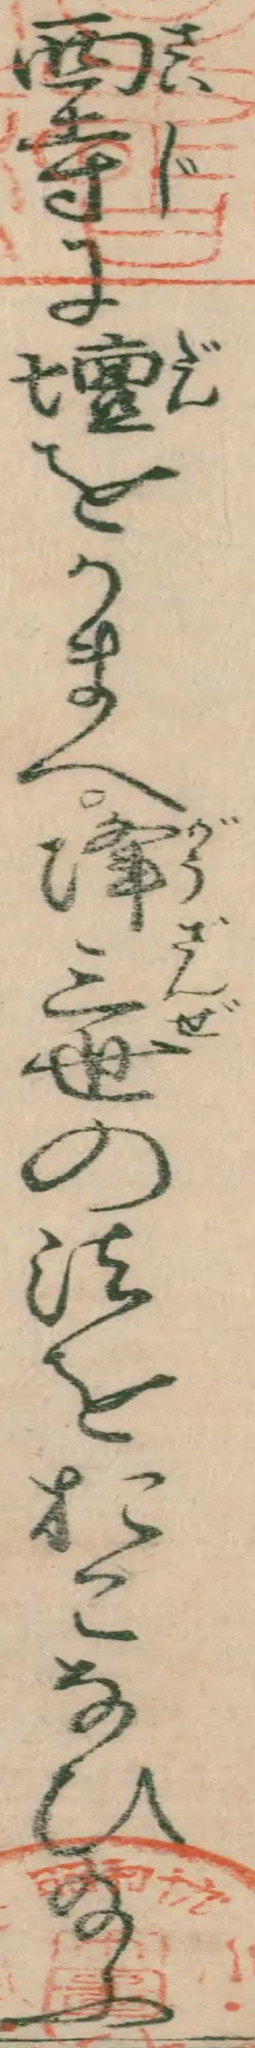西寺に壇をかまへ。降三世の法をおこなひ給ふ
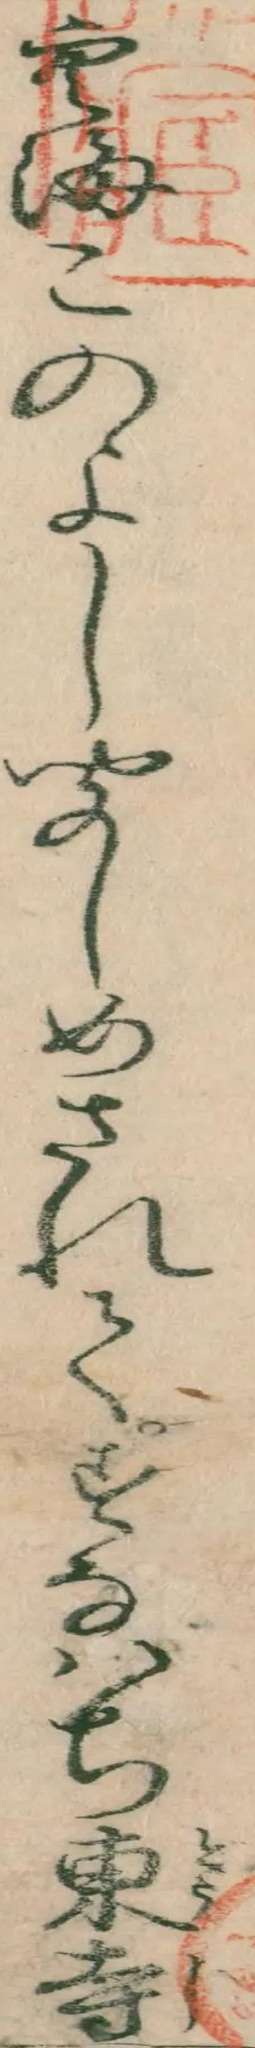空海このよし聞しめされて。すなはち東寺
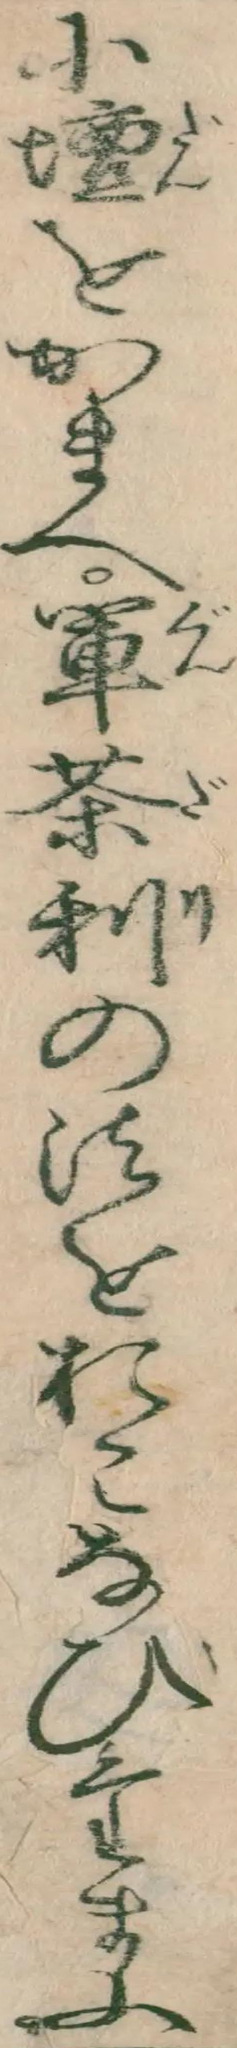に壇をかまへ。軍荼利の法をおこなひたまふ
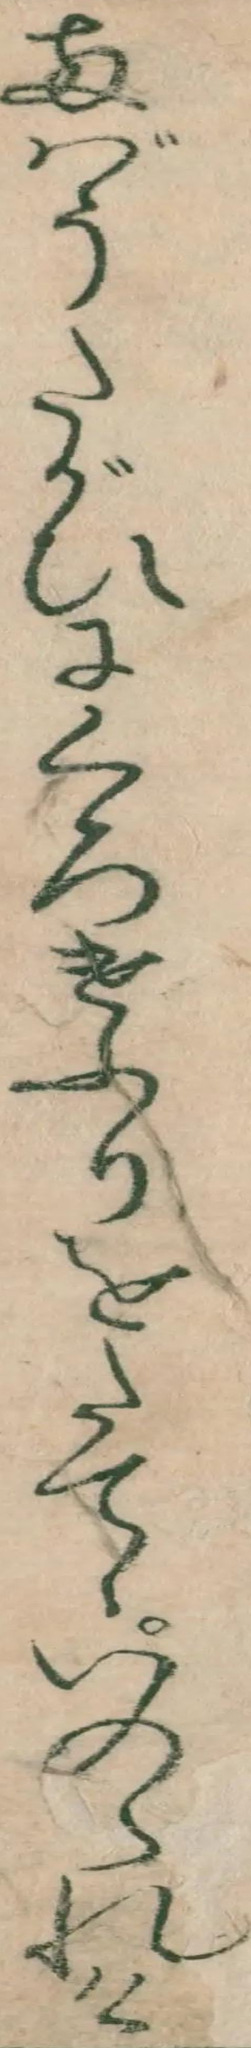両ばうたがひにくろけふりをたてゝ。いのられけ
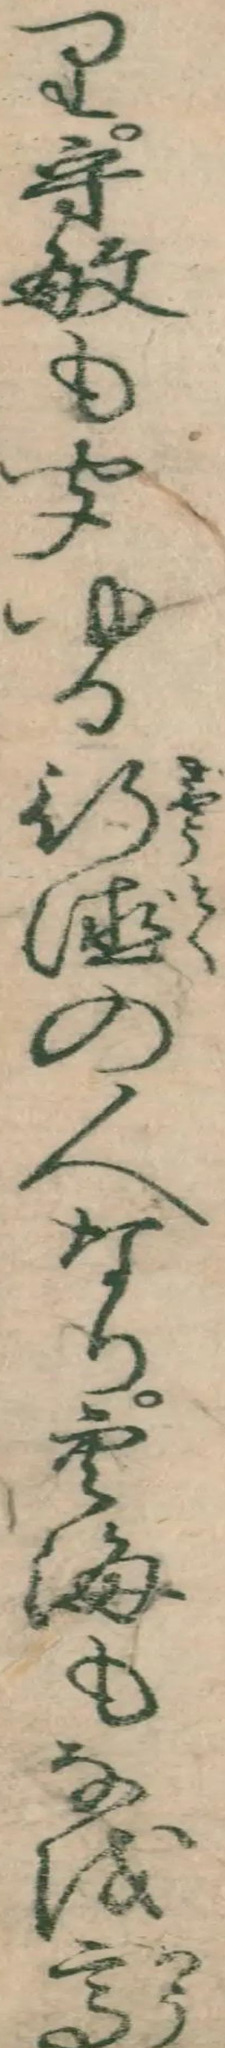り。守敏も聞ゆる行徳の人なり。空海もなを高

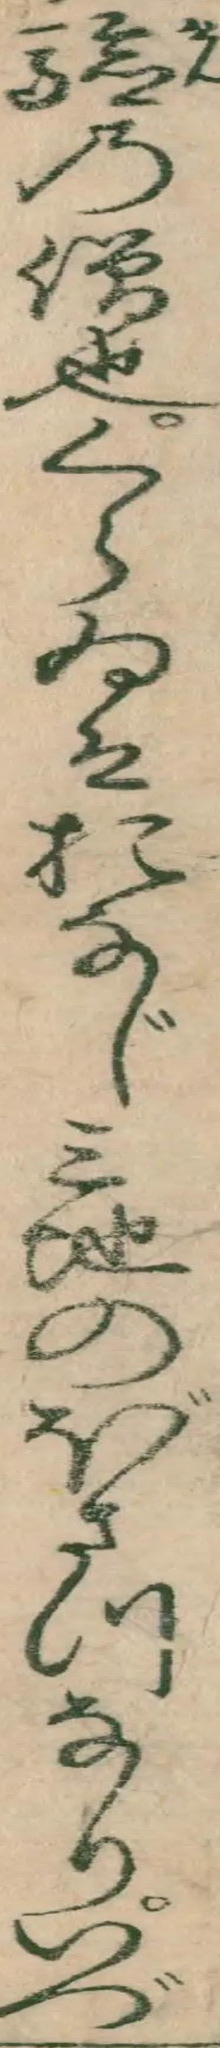験の僧也。くらゐはおなじ三地ぼさつなり。いづ
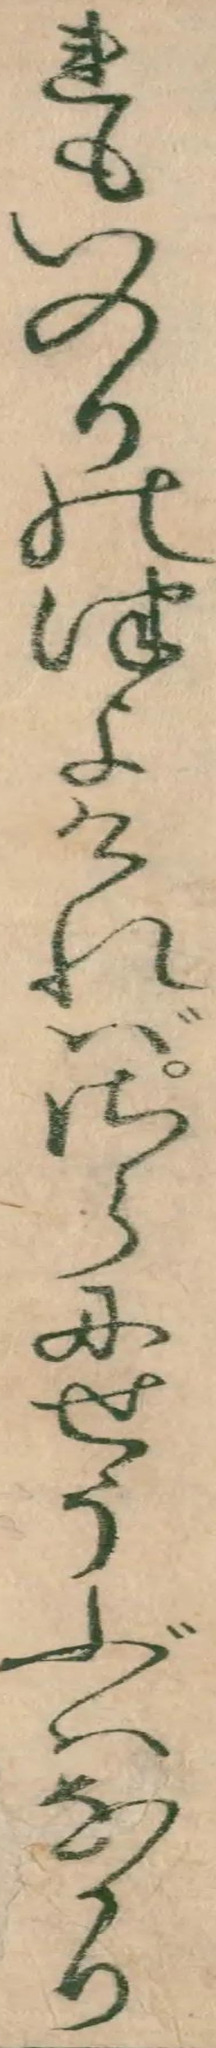れもいのりのつよければ。さらにせうぶはなかり
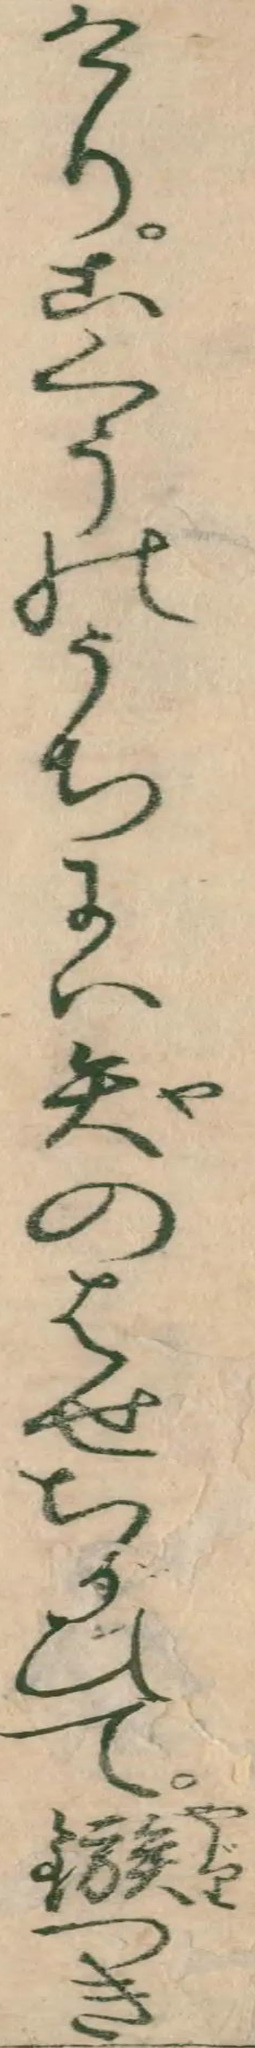けり。こくうのうちには矢のはせちかひて。鏃つき
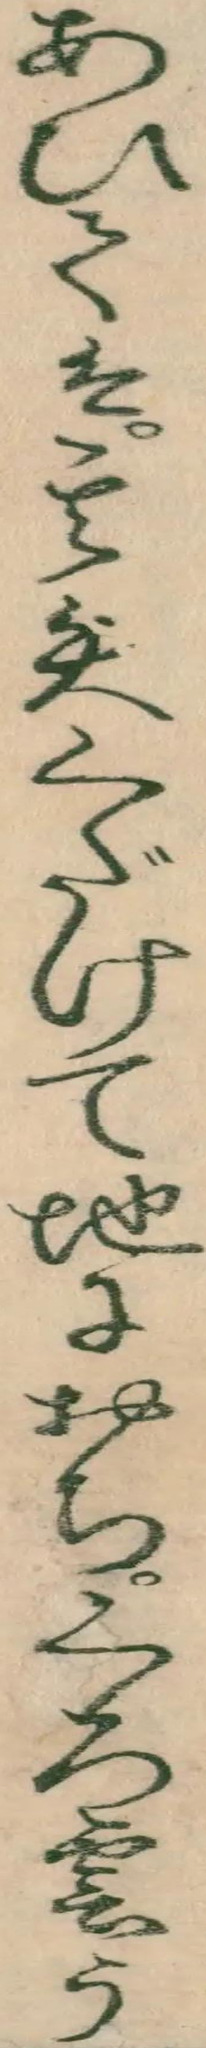あひては。其矢くだけて地におち。くろ雲う
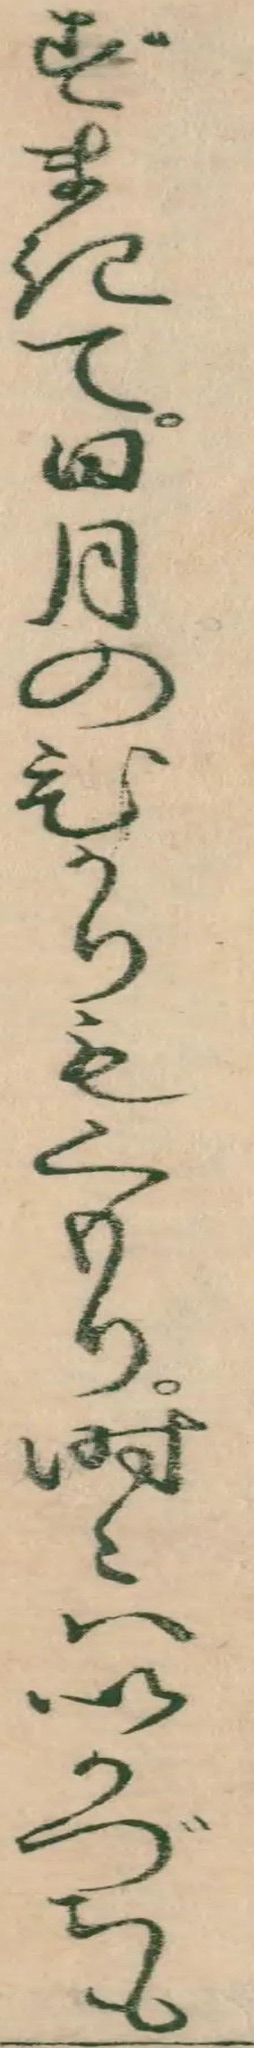ずまきて。日月のひかりもくもり。時々はいかづちも
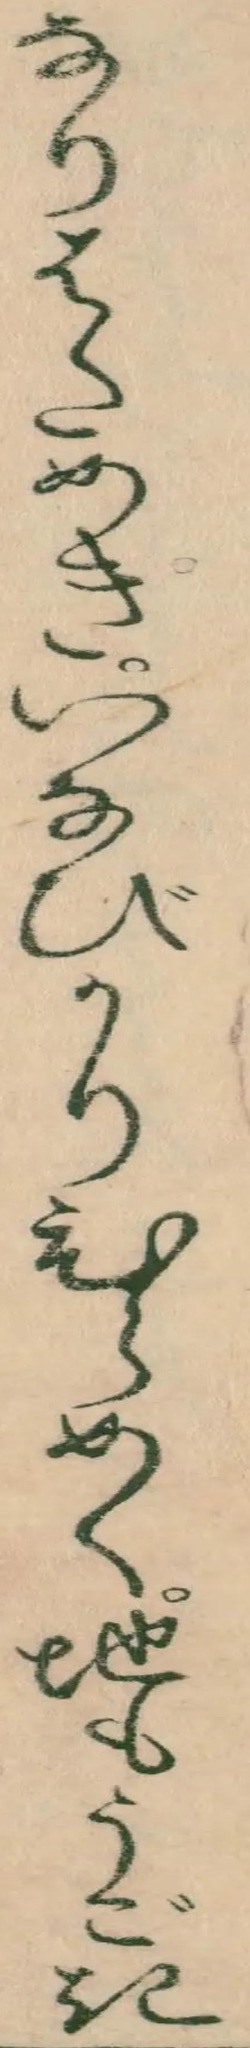なりはためき。いなびかりひらめく。地もうごき
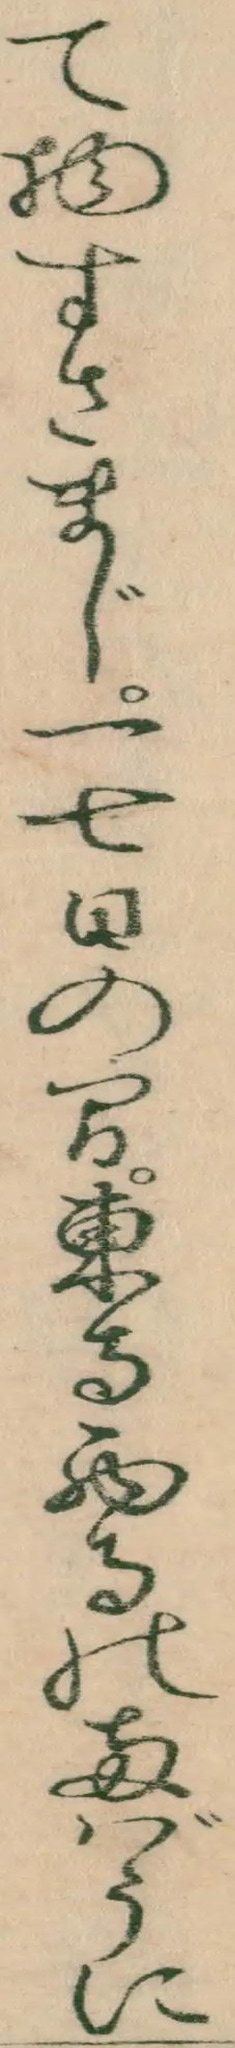て物すさまじ。一七日の間。東寺西寺の両ばうに
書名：弘法大師御本地 3巻. [3]
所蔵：国立国会図書館 National Diet Library, JAPAN
